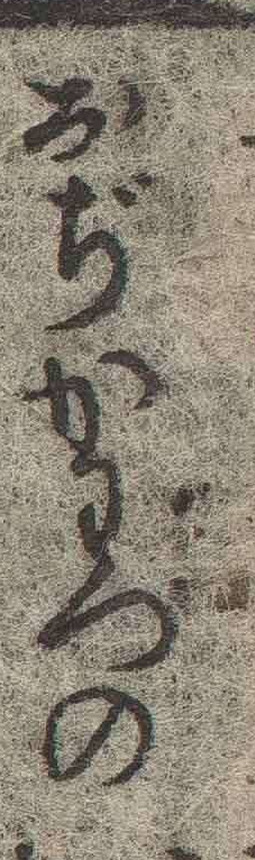おぢかわつの
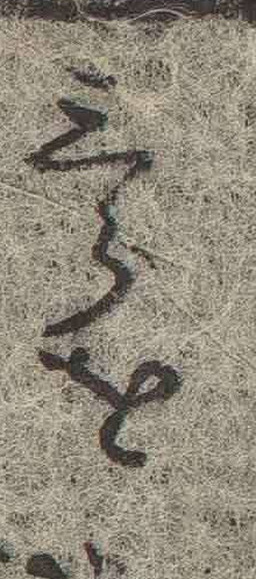三郎を
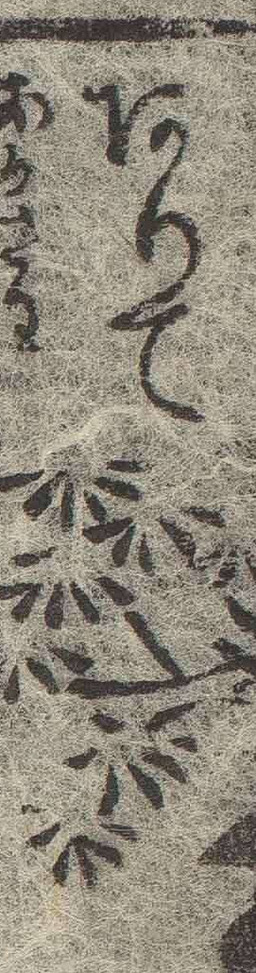ありて
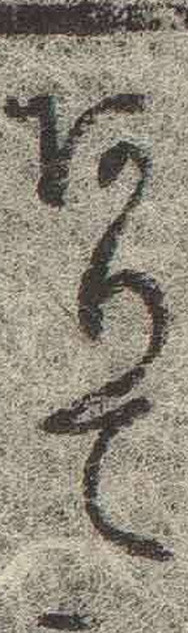ありて
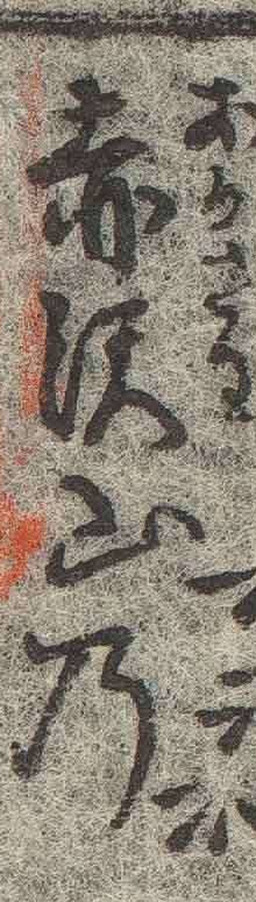赤沢山の
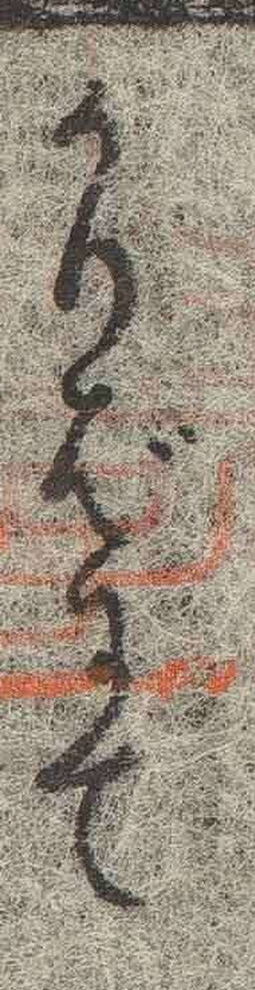かりばにて
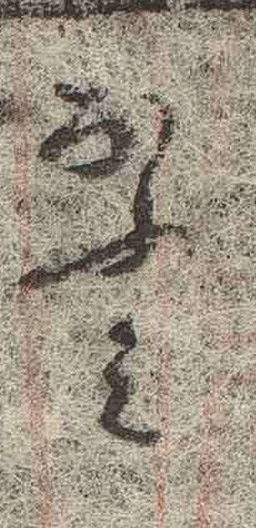おふみ
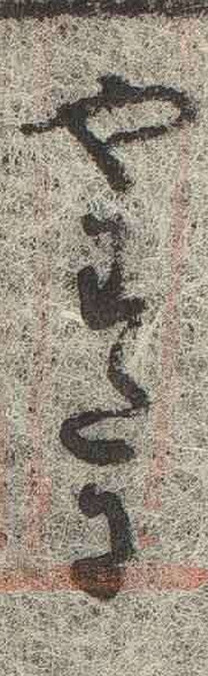やわたに
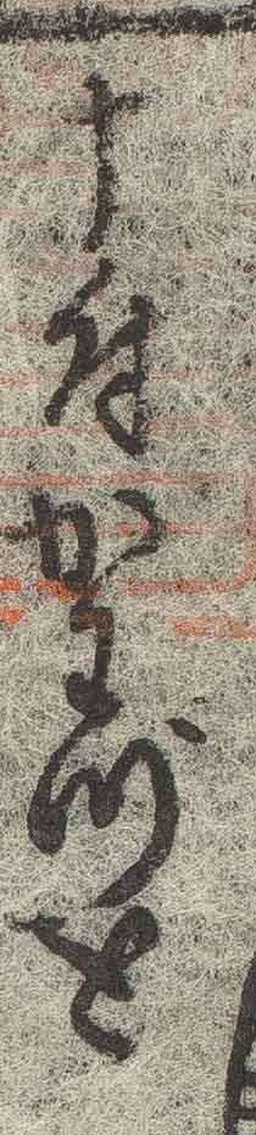申付かわづを
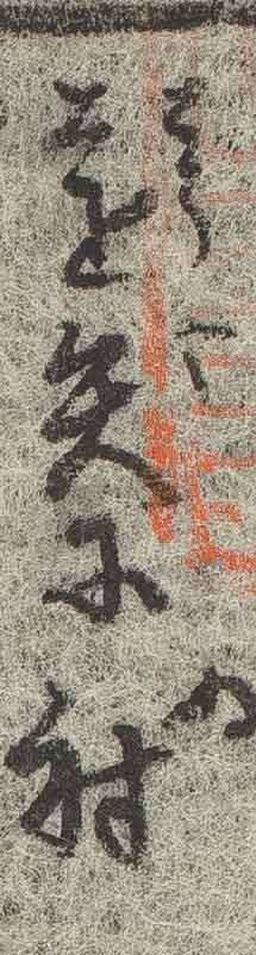遠矢に射
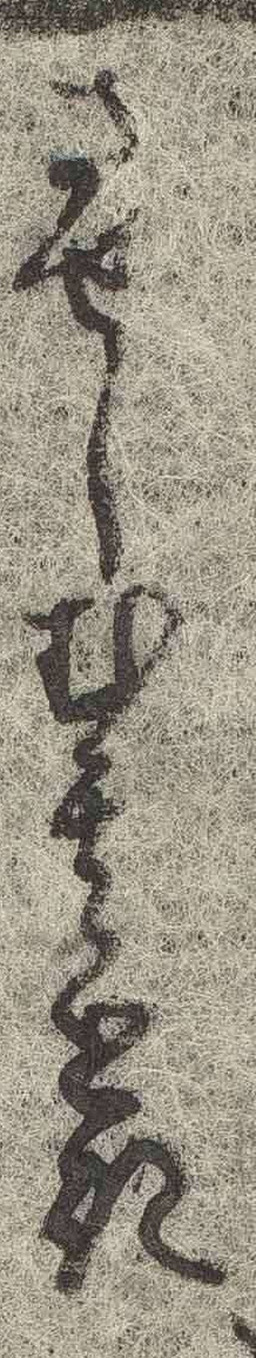させしむ其とき
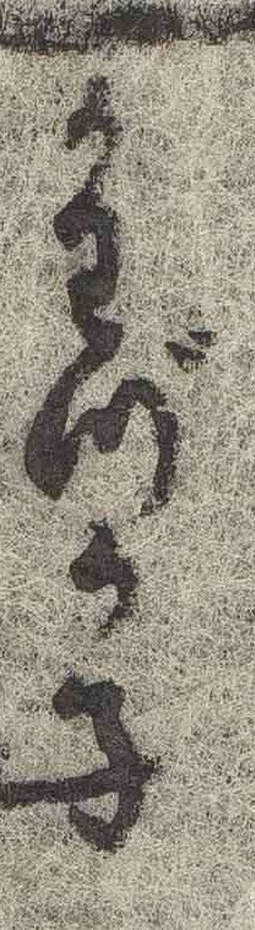かわづか子
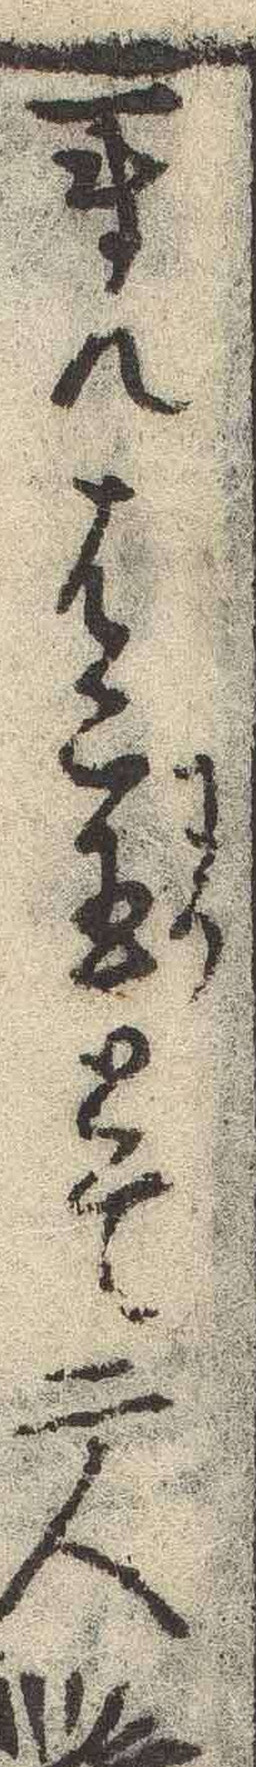一まんはこ王とて二人
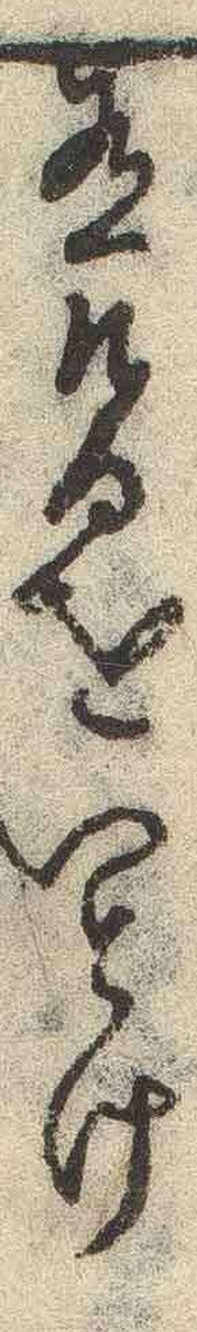有けるをいとけ
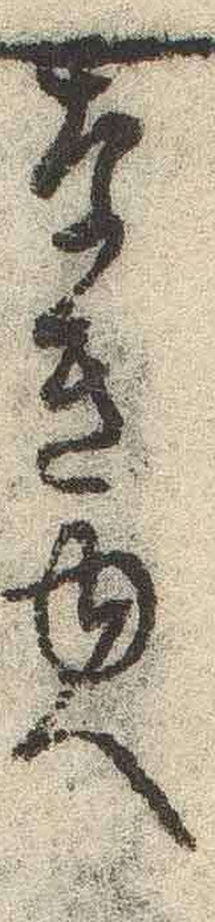なきゆへ
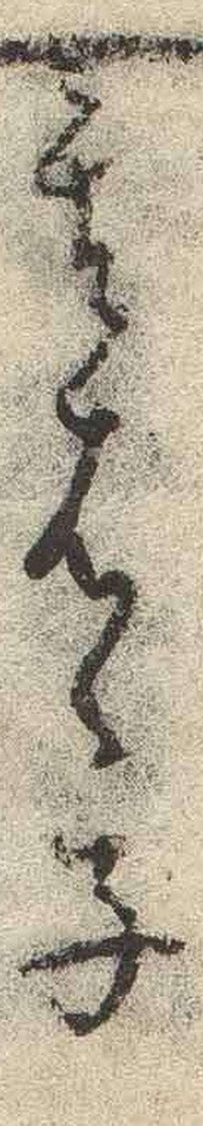其はゝ子
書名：末広扇
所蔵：東京学芸大学附属図書館 国文学研究資料館
